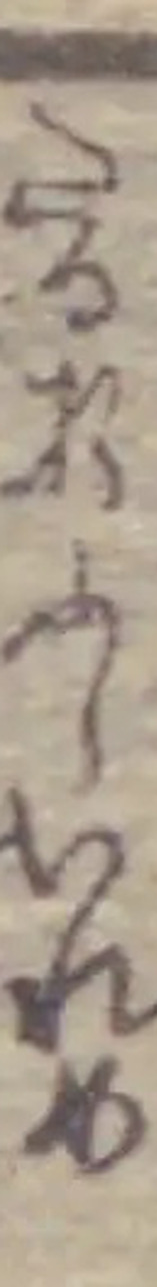たる折ふしいれめ
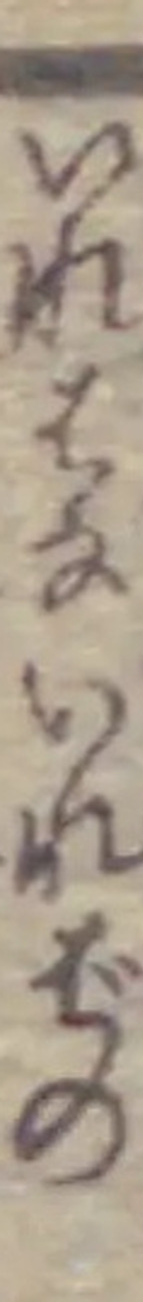いれはないればの
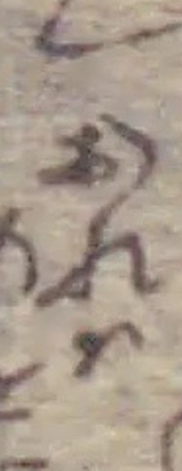おれは
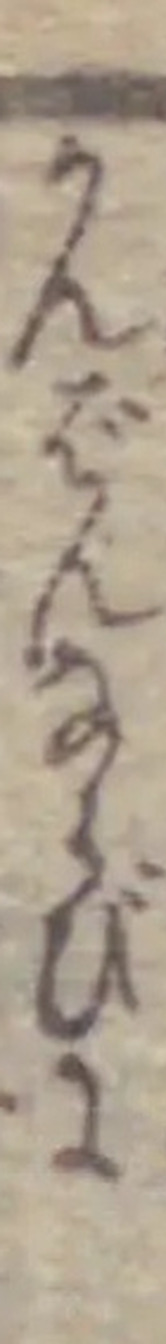かんばんならびに
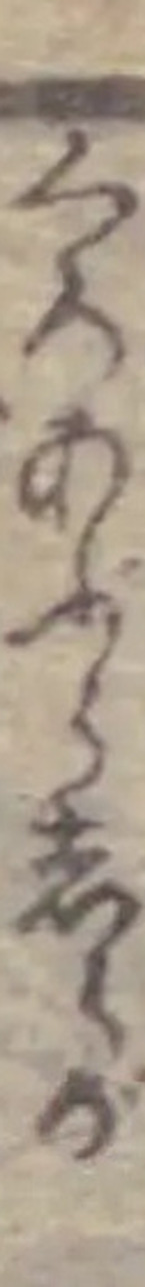くろあぶらしらが
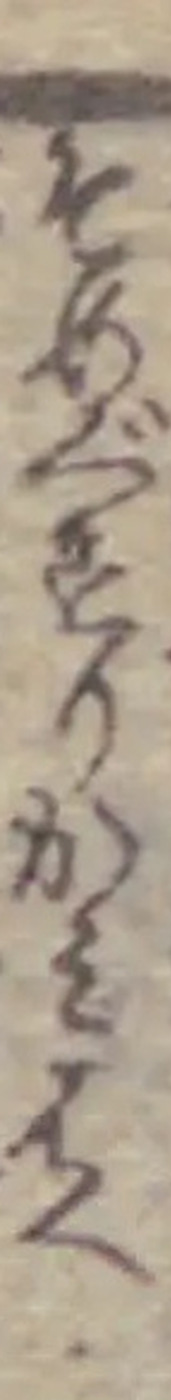そめぐすりかみはへ
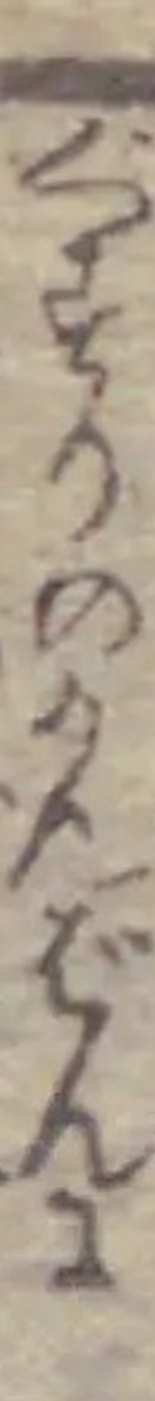ぐすりのかんばんに
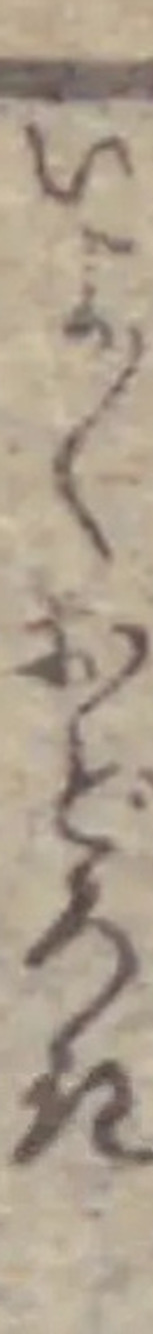いよいよおどろき
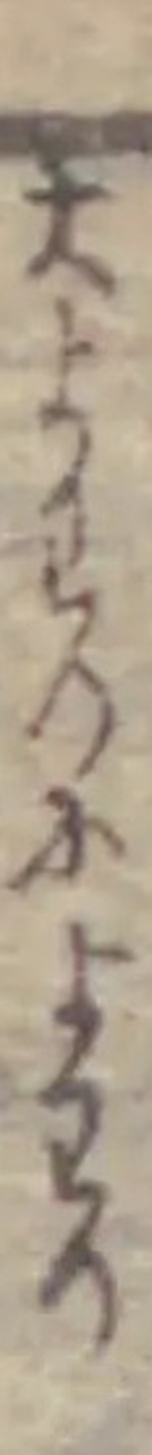大よわりによわり
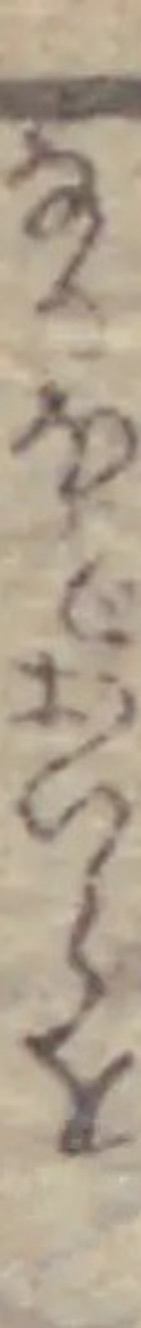なるほどおいらを
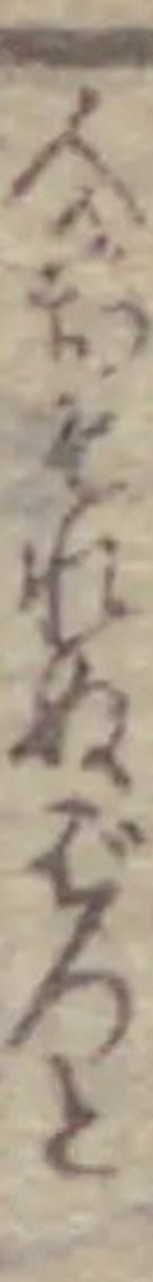人かおそれぬはつと
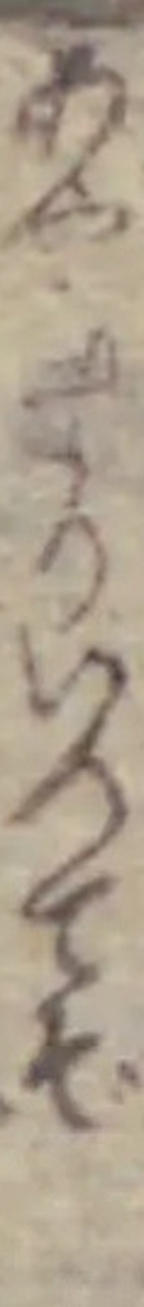あやまりいつてぞ
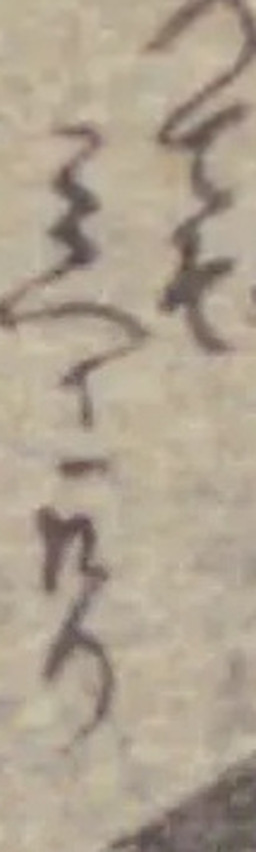みへにけり
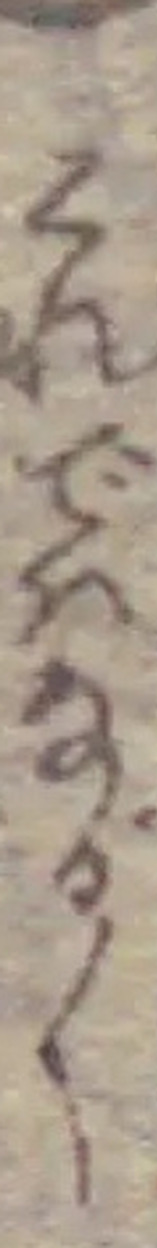これではなる〳〵
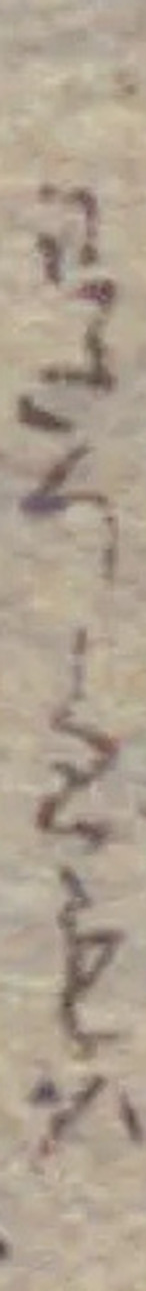わたくしともは
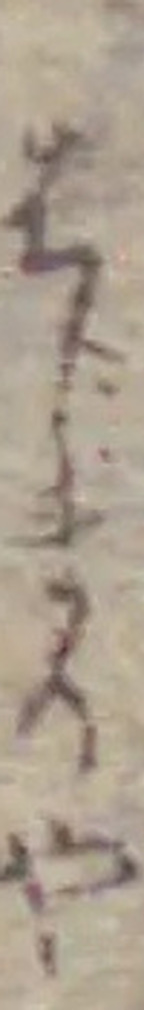はじまりや
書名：化物大閉口 2巻
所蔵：国立国会図書館 National Diet Library, JAPAN
